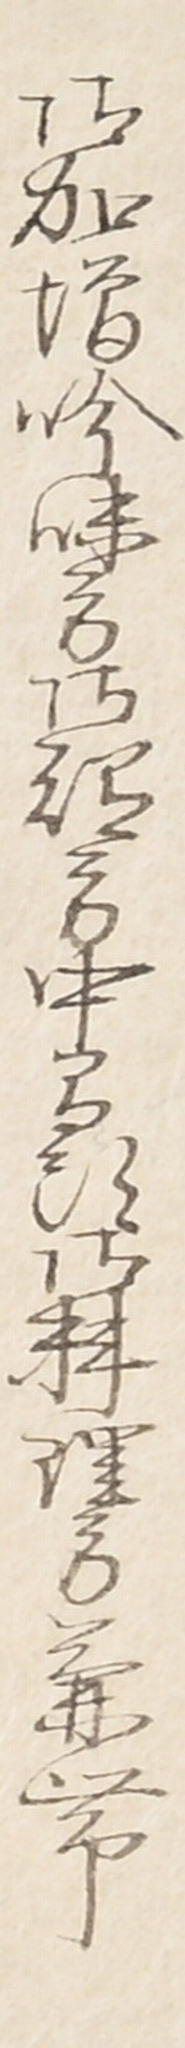御加増吟味方御賄方中間頭御料方兼帯
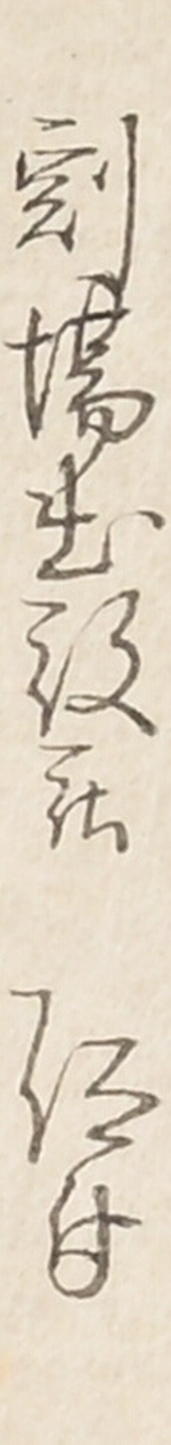割場出役被仰付
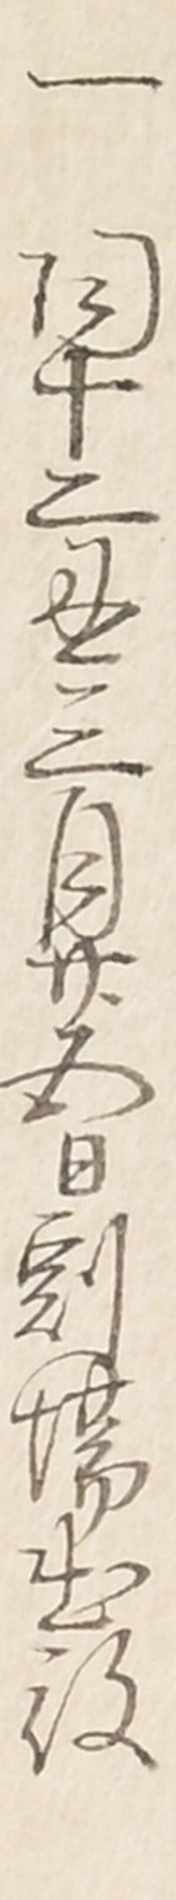一同十二丑三月廿五日割場出役
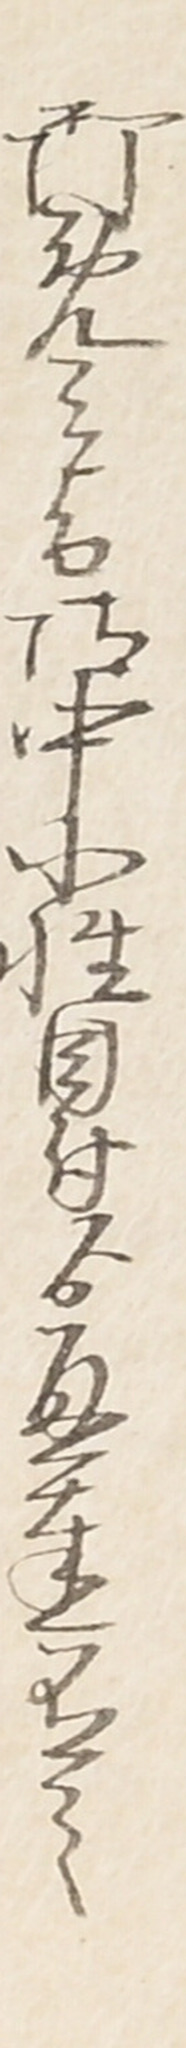御免之旨御中小性目付ゟ通達有之
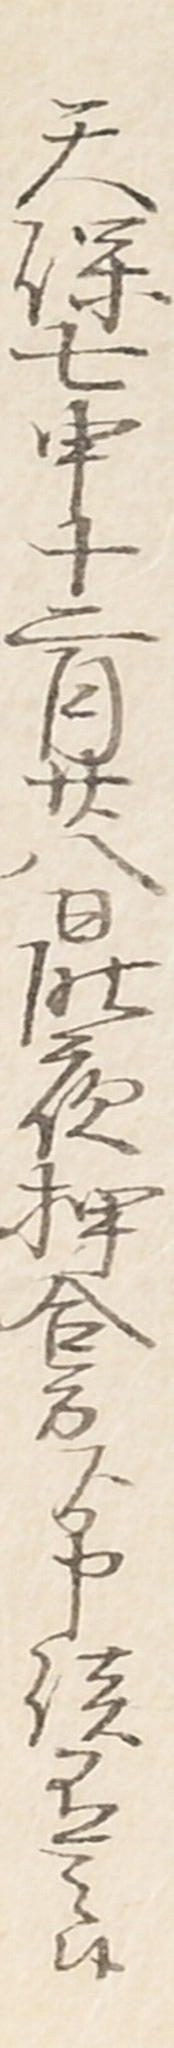一天保七申十二月廿八日昨夜押合方ゟ申談有之候
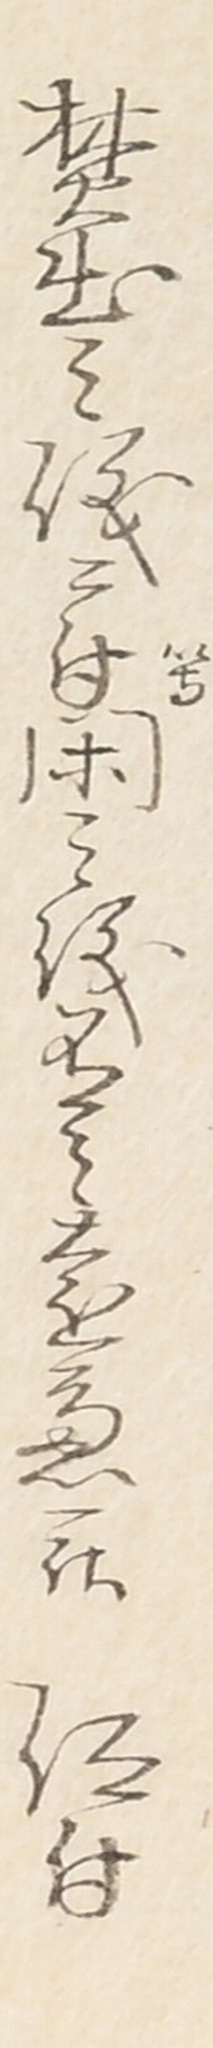焚出之儀ニ付等閑之儀有之遠慮被仰付
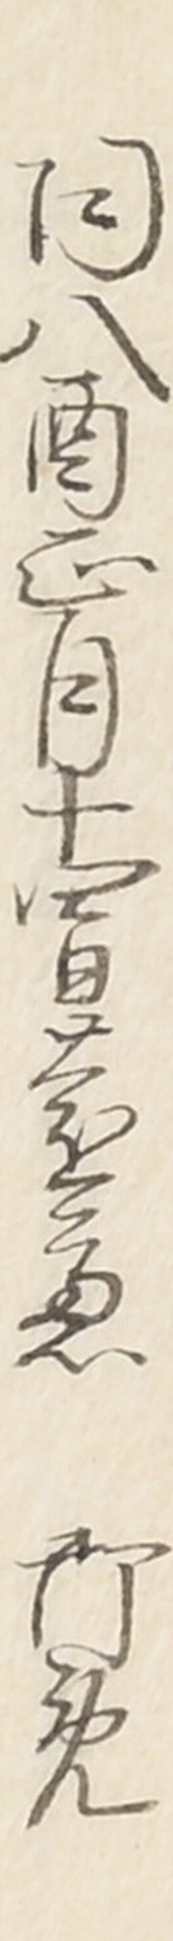一同八酉正月十四日遠慮御免
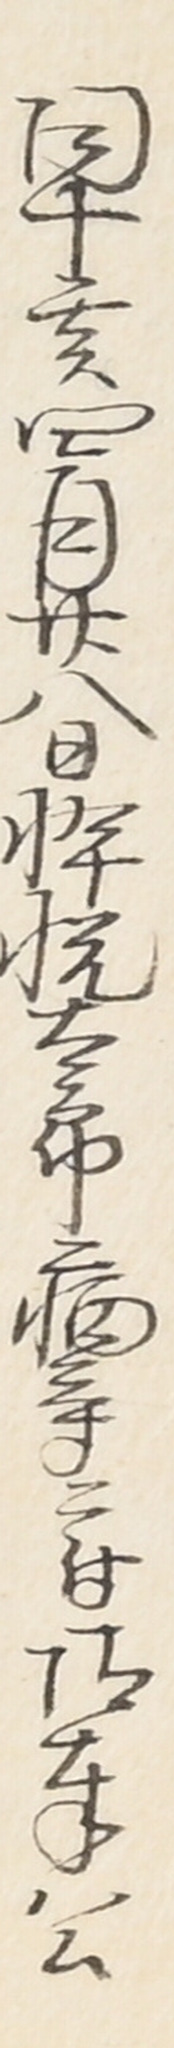一同十亥四月廿八日忰悦太郎病気ニ付御奉公
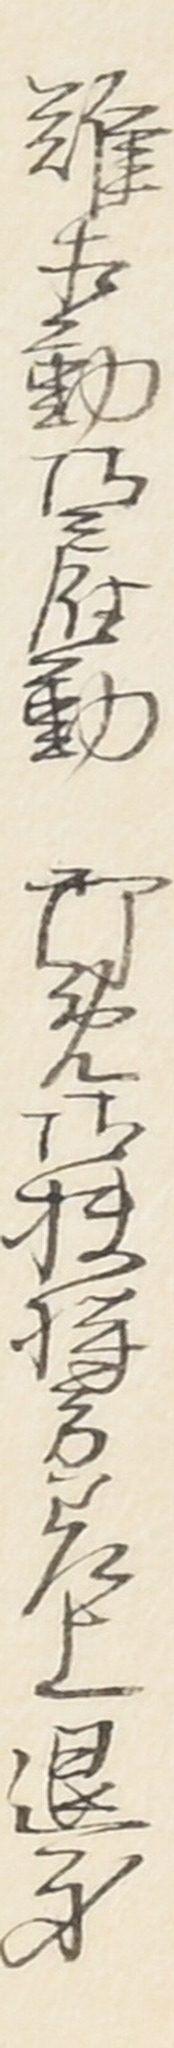難相勤御雇勤御免御扶持方差上退身
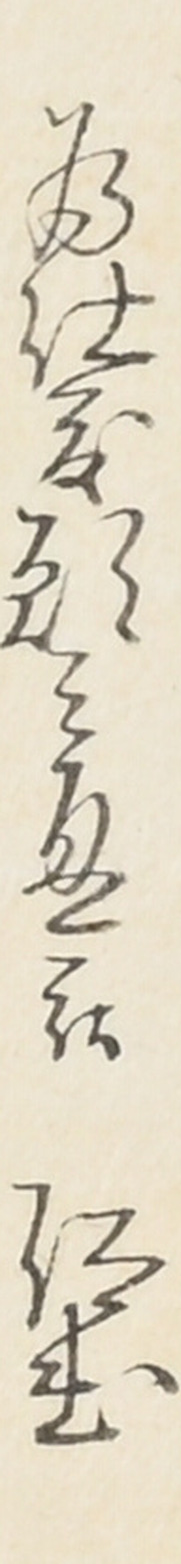為仕度願之通被仰出
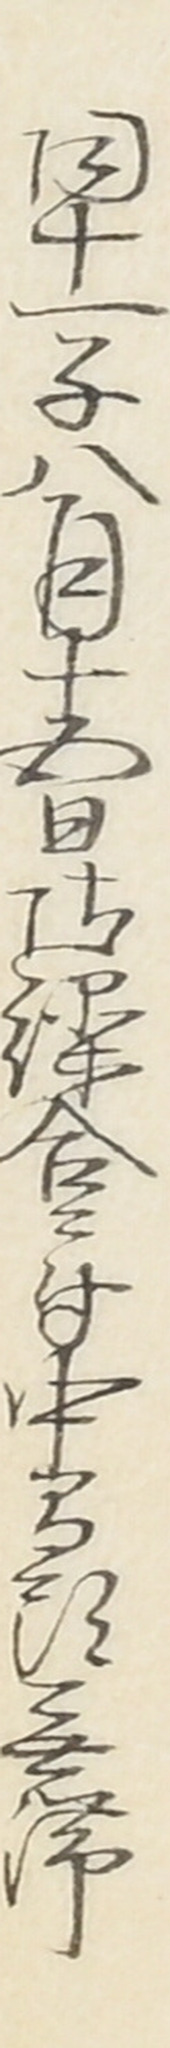一同十一子八月十五日御繰合ニ付中間頭無滞
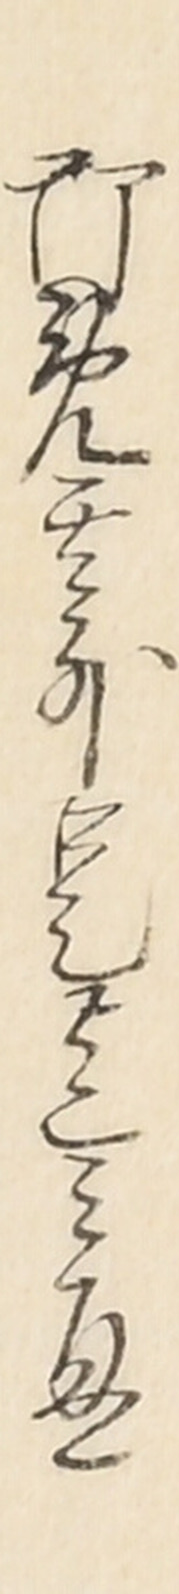御免其外是迄之通
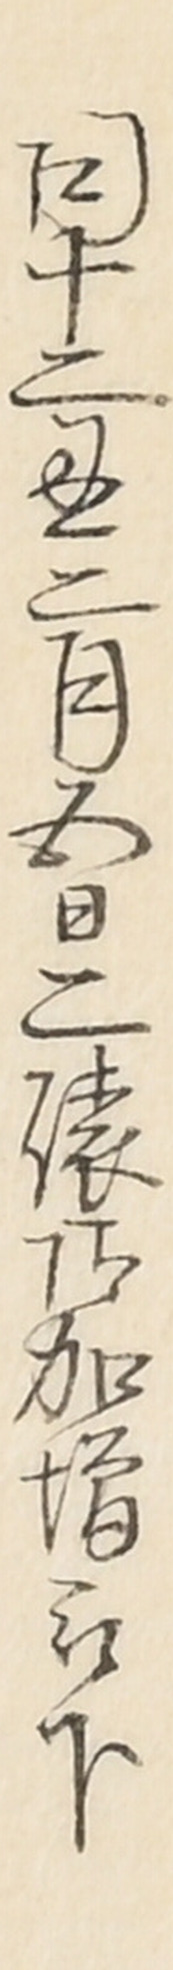一同十二丑二月五日二俵御加増被下
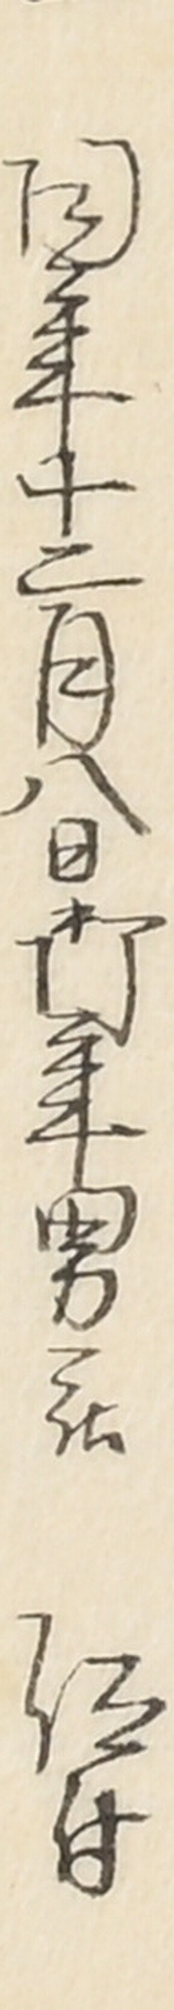一同年十二月八日年男被仰付
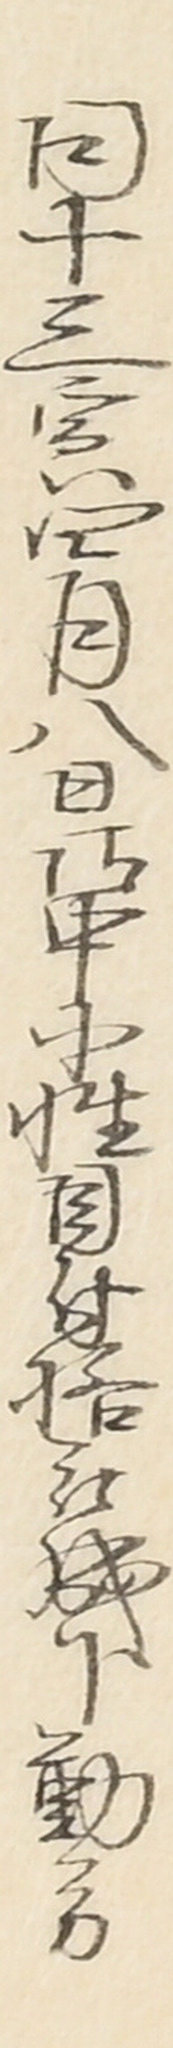一同十三寅四月八日御中小性目付格被成下勤方
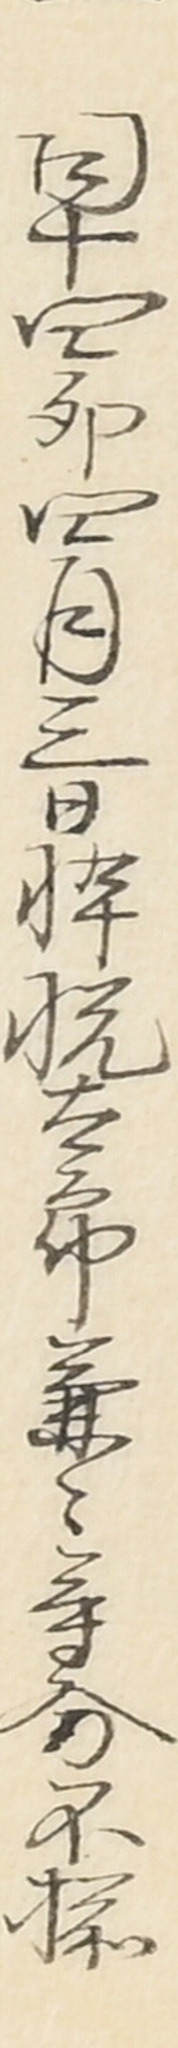一同十四卯四月三日忰悦太郎兼々気分不揃
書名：無足諸士勤仕録（四）
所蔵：伊那市立高遠町図書館・合同会社AMANE
